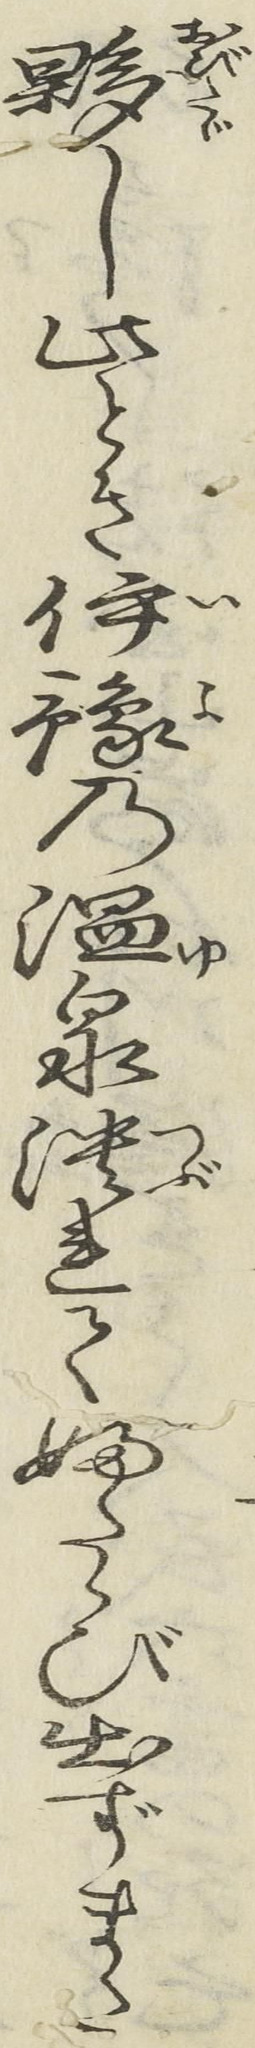夥し此とき伊豫の温泉潰れてふたゝび出ずまた
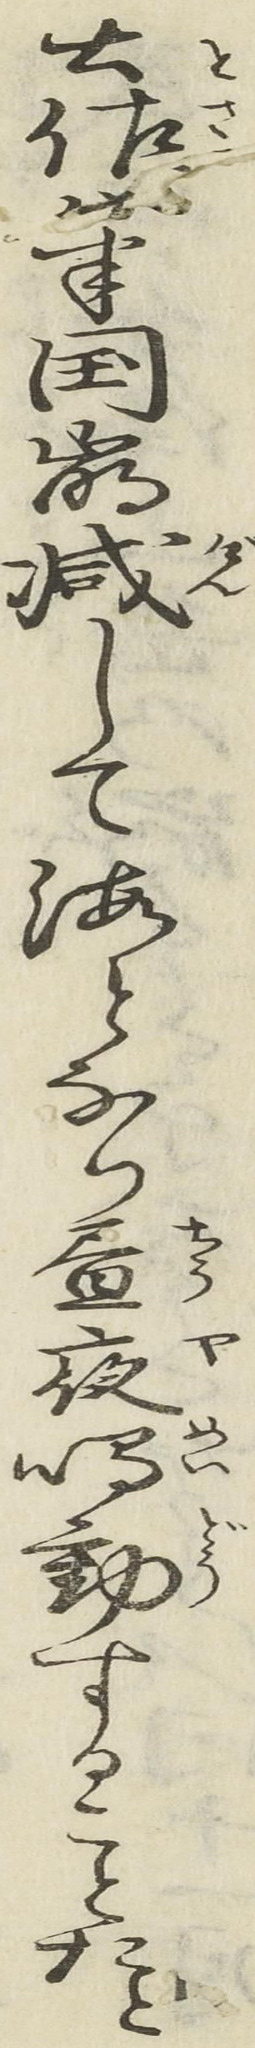土佐等半国崩減して海となり昼夜鳴動することたと
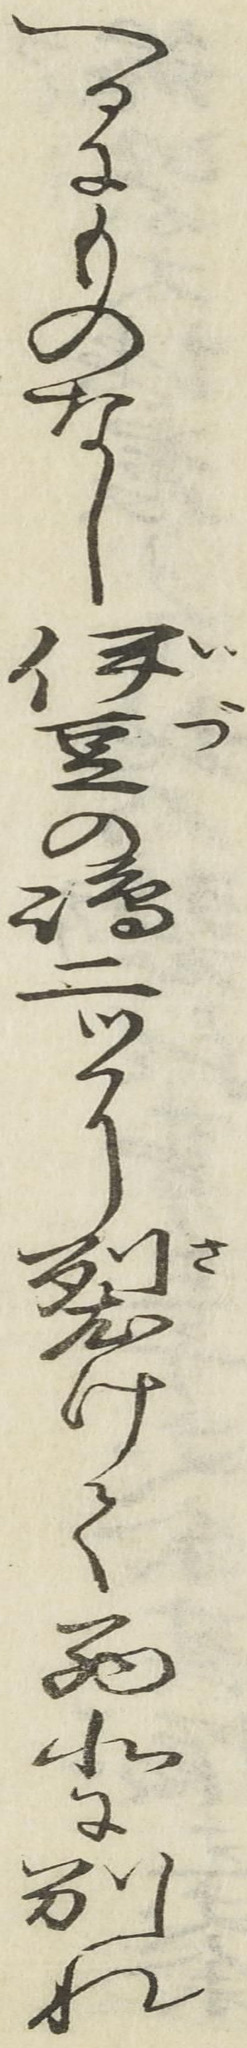へるにものなし伊豆の嶋二ツに裂て西北に別れ
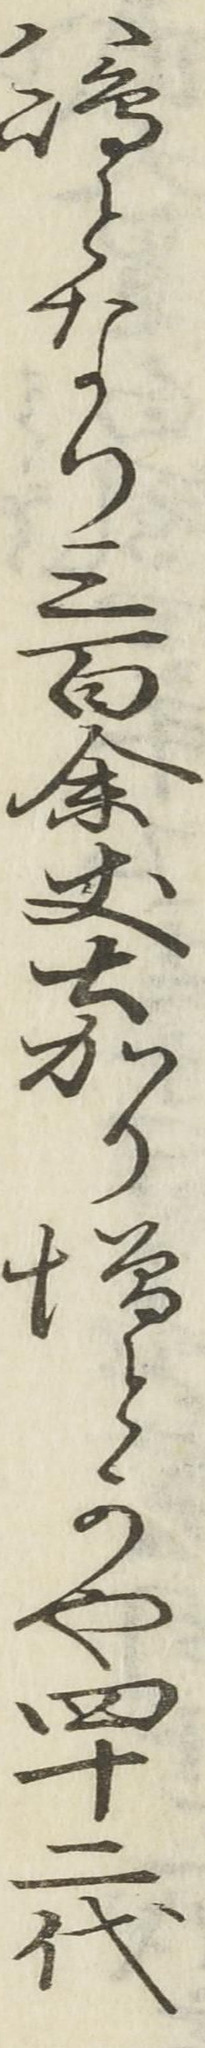八嶋となり三百四丈土加り増とかや四十二代
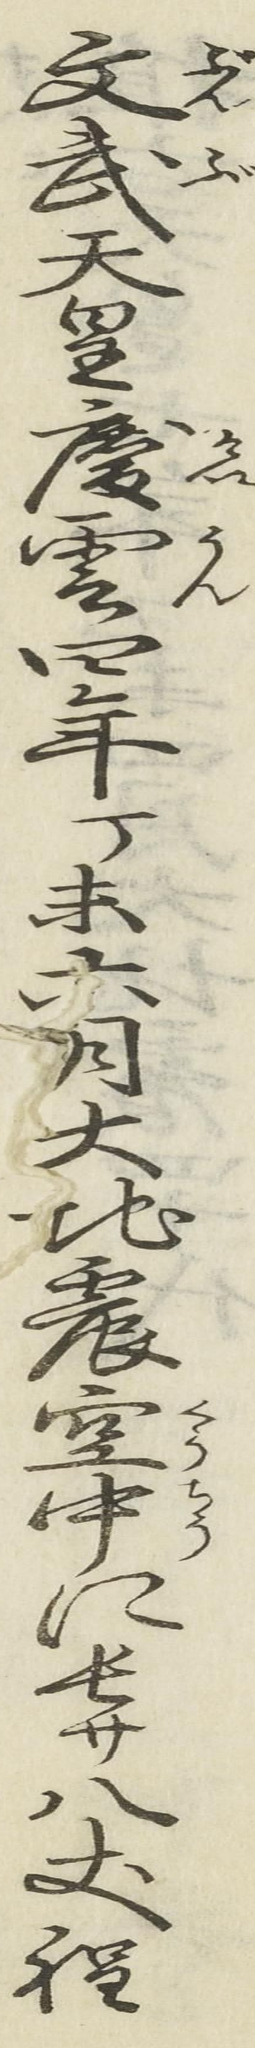文武天皇慶雲四年丁未六月大地震空中に長サ八丈程
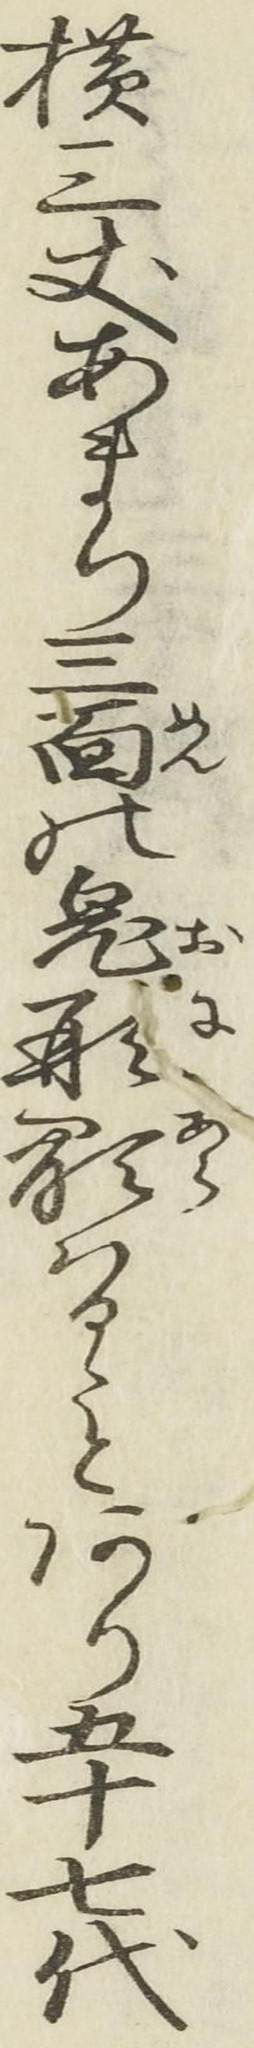横三丈あまり三面の鬼形顕はるとあり五十七代
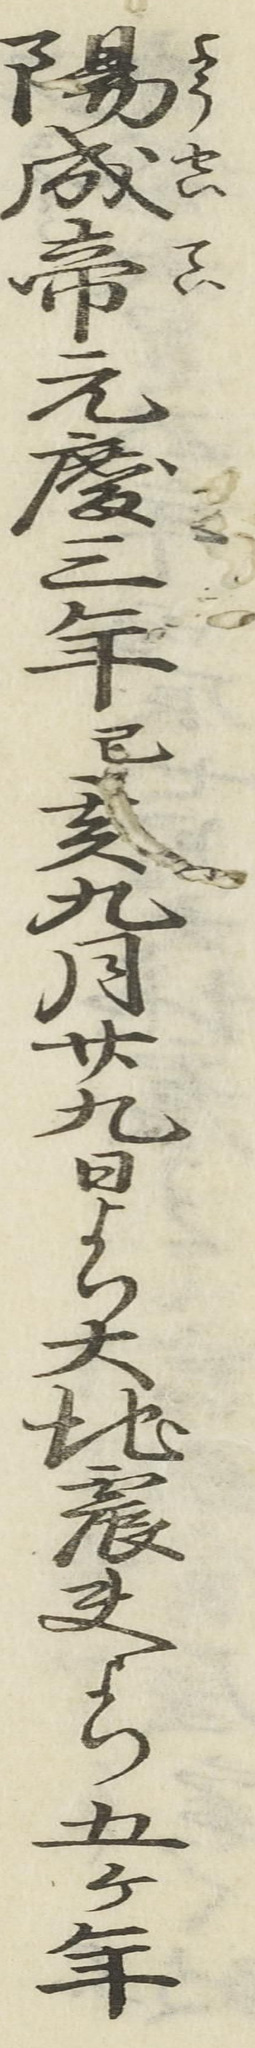陽成帝元慶三年己亥九月廿九日より大地震夫より五ヶ年
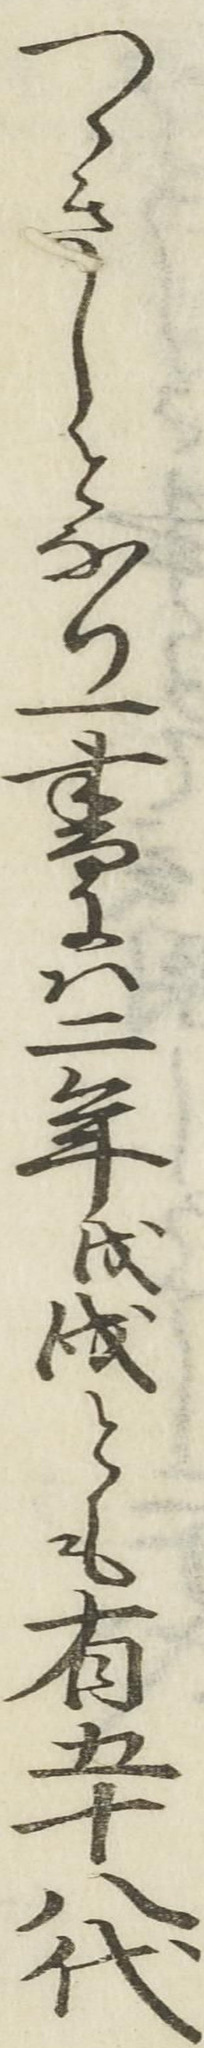つゝきしとなり一書には二年戊戌とも有五十八代
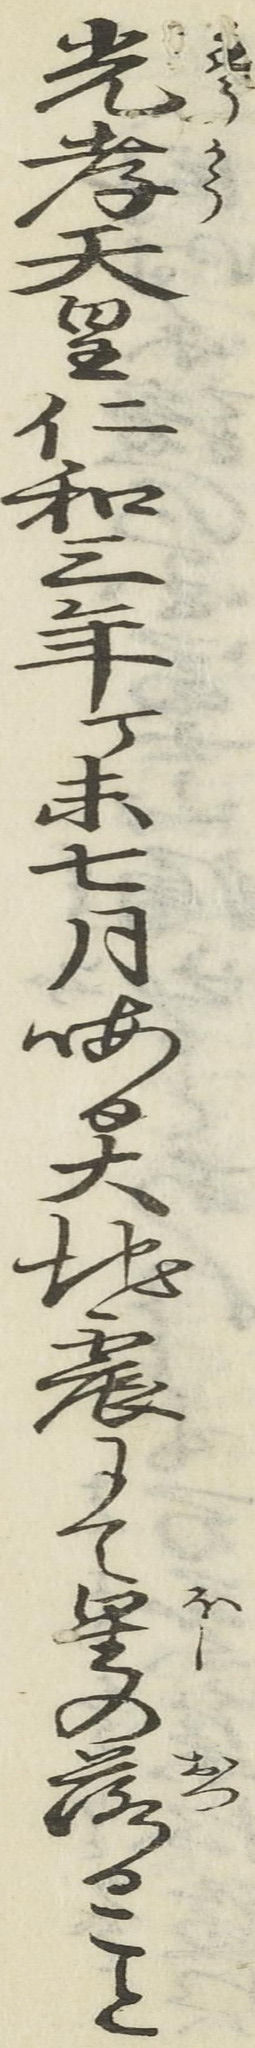光孝天皇仁和三年丁未七月晦日大地震にて星の落ること
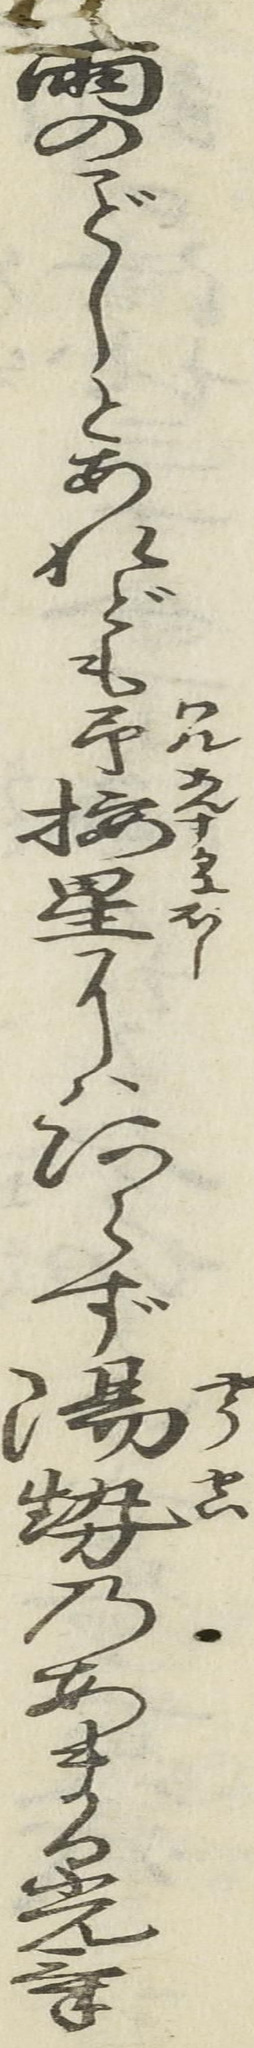雨のごとしとあれども予按星にあらず陽勢のあまる光気
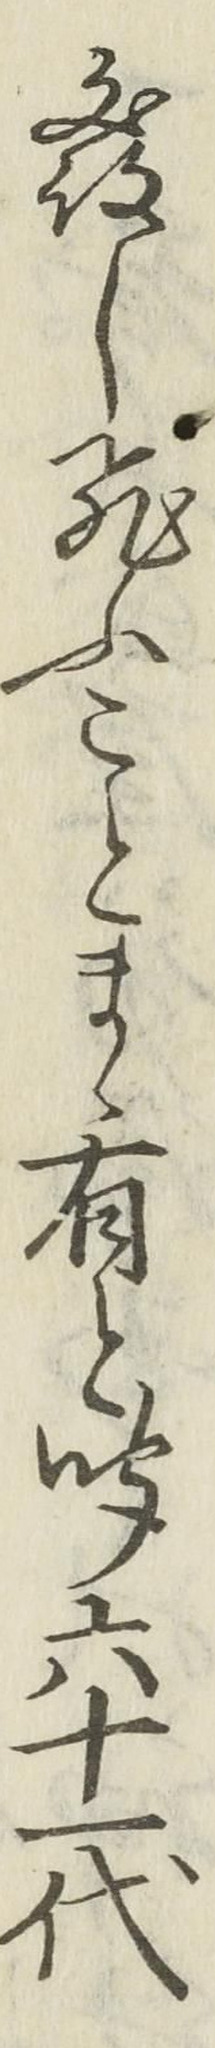發し飛ふことまゝ有と聞六十一代
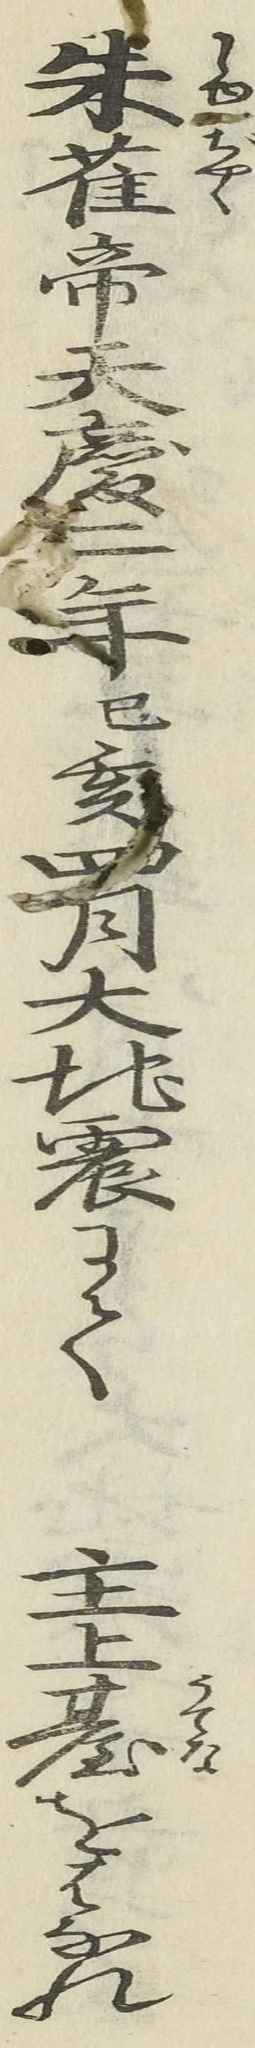朱雀帝天慶二年己亥四月大地震にて主上臺をはなれ
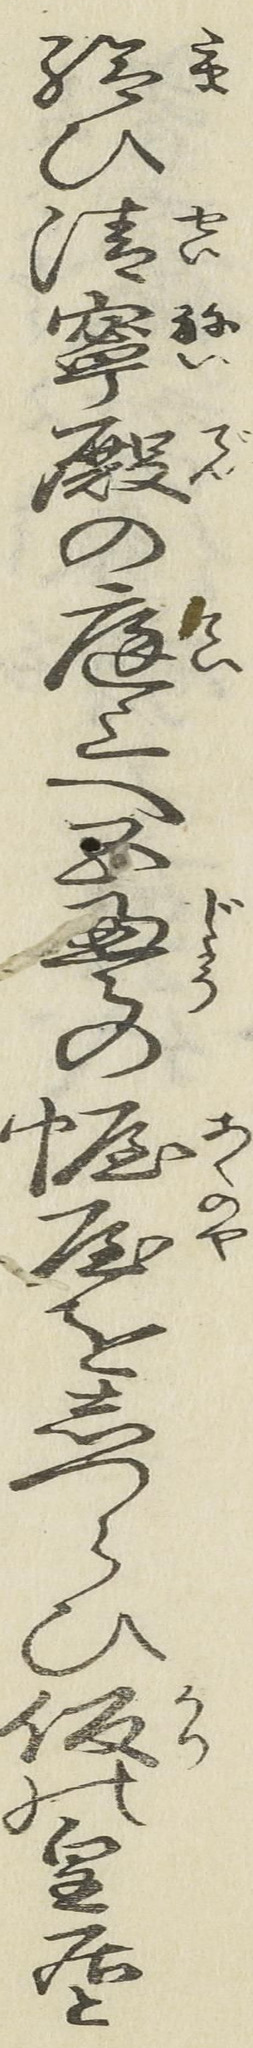給ひ清寧殿の庭上へ五畳の幄屋をしつらひ仮の皇居と
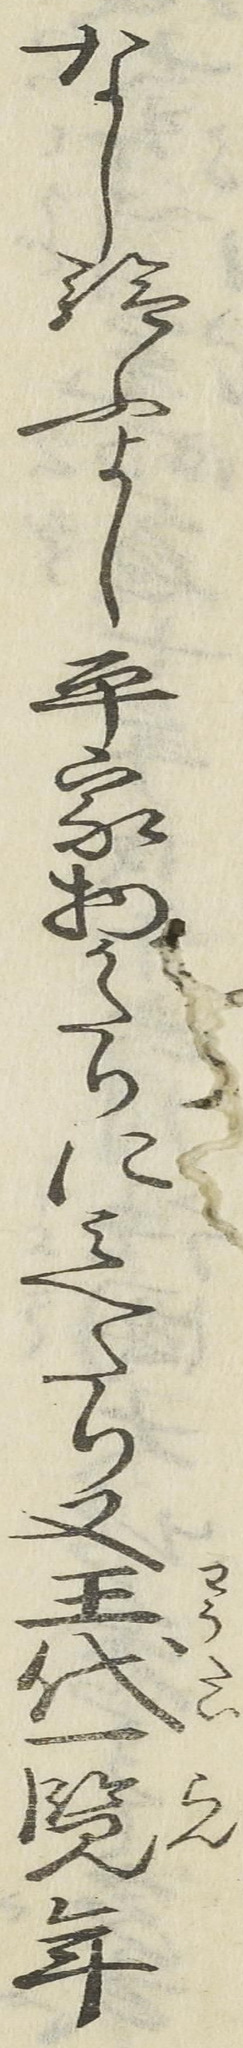なし給ふよし平家物かたりにみへたり又王代一覧年
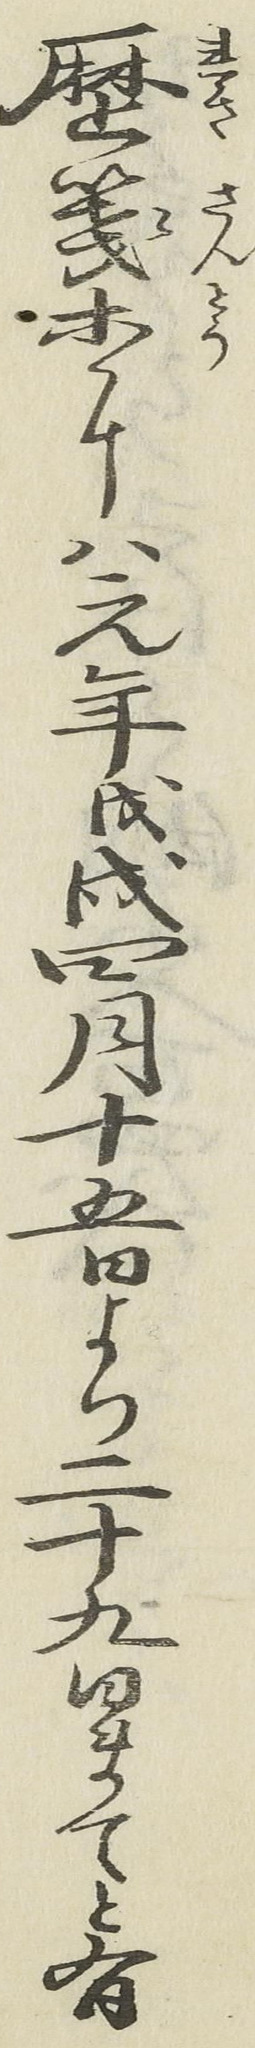歴纂等には元年戊戌四月十五日より二十九日まてと有
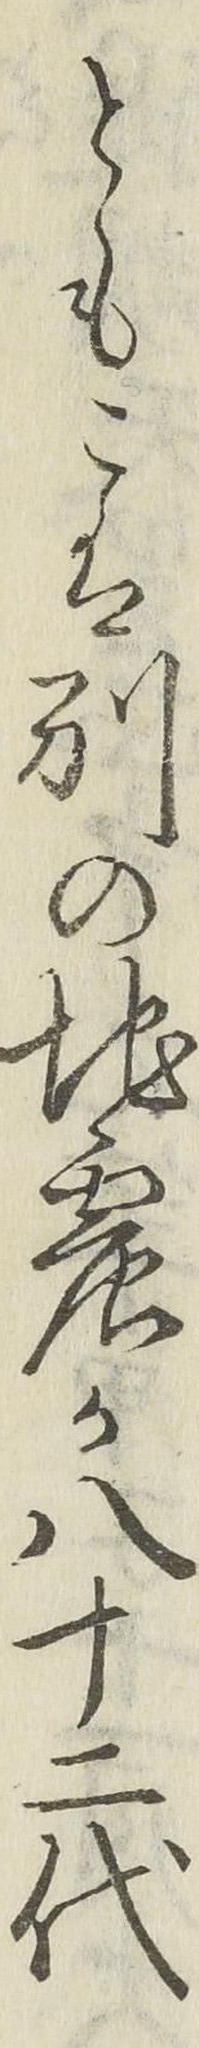ともこは別の地震か八十二代
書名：震雷考説　全
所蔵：東京大学地震研究所図書室 Earthquake Research Institute Library, The University of Tokyo, JAPAN
